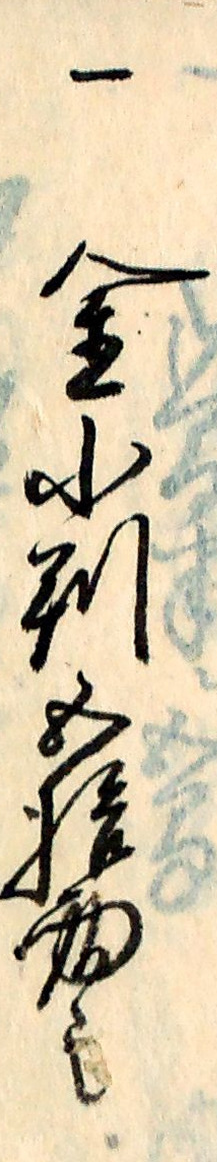一金小判五拾也
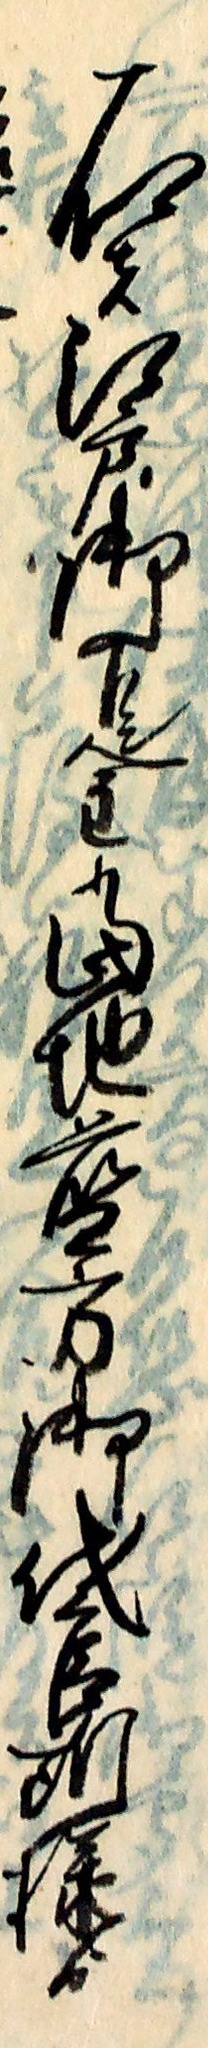右は江戸御下し金当地藍方御代官所様ゟ
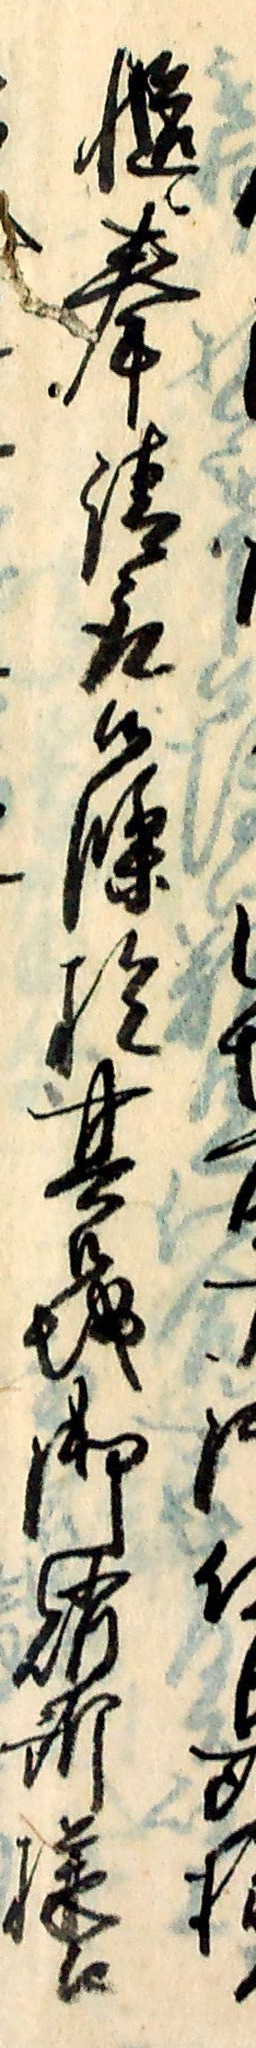慥に奉請取候条於其御地御賄所様え
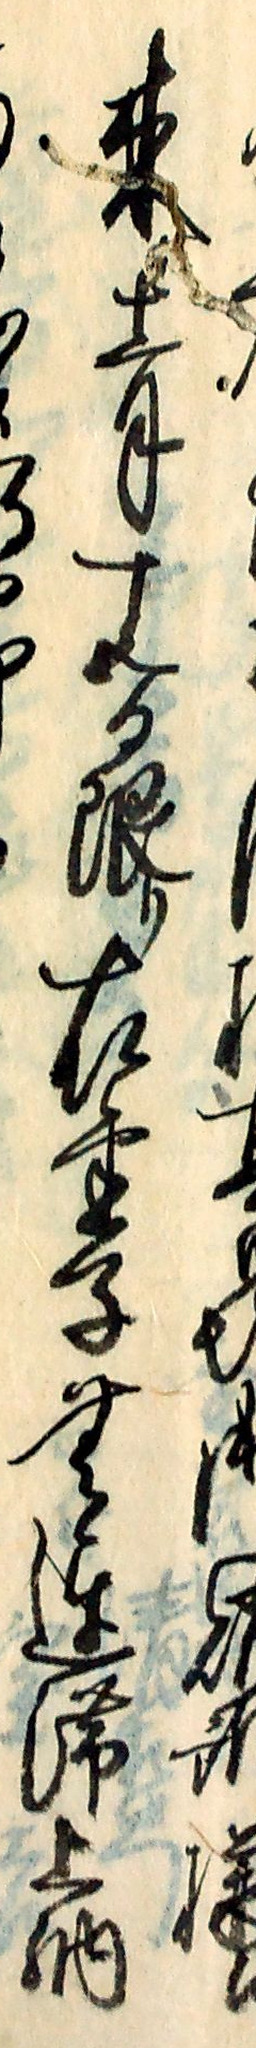来十二月十五日限り右金子無遅滞上納
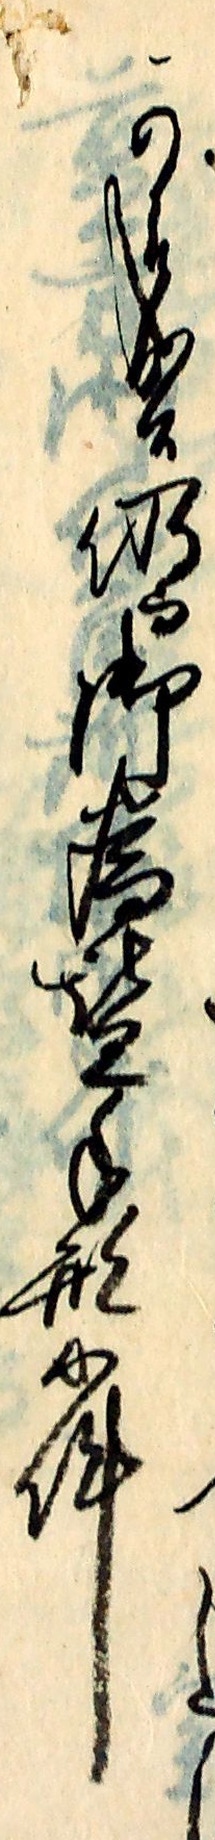可被成候仍て御為替手形如件
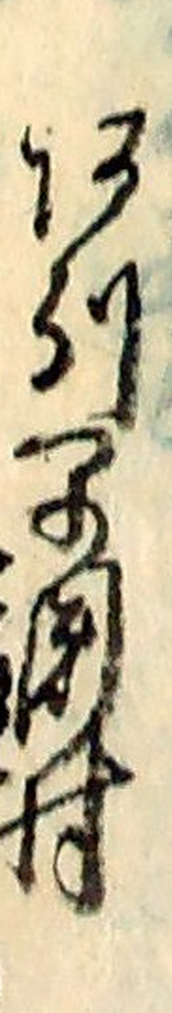阿州早淵村
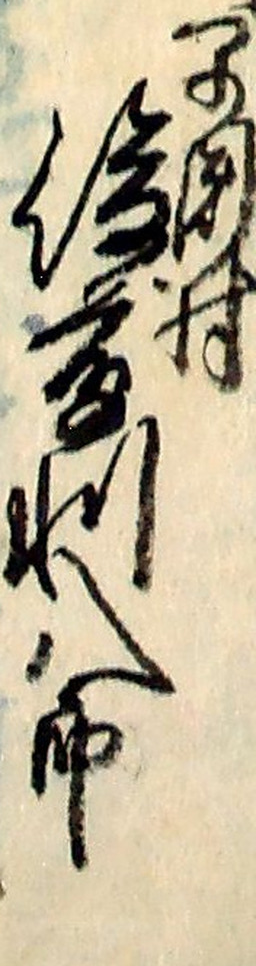後藤利八郎
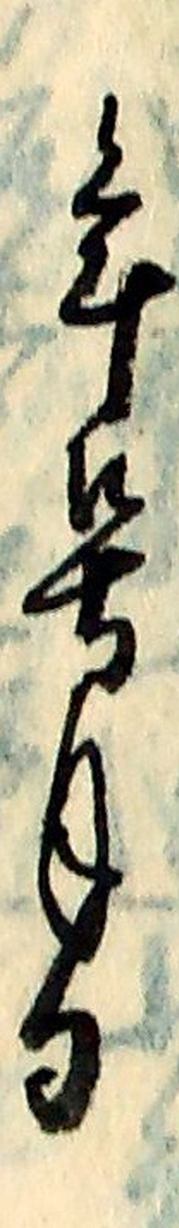年号月日
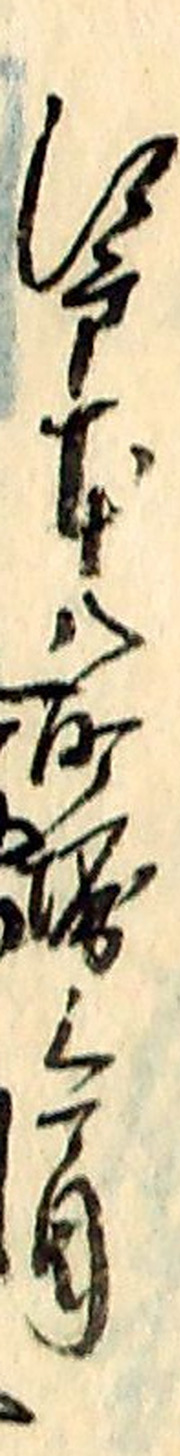江戸本八町堀三丁目
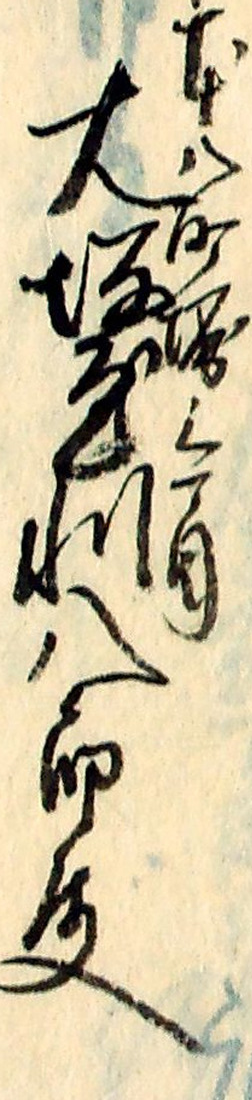大坂屋利八郎殿

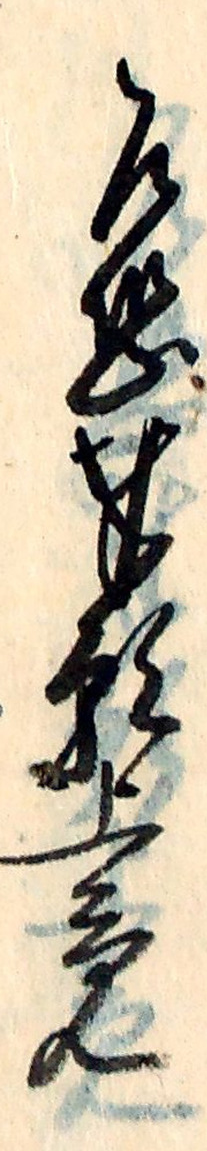乍恐奉願上覚
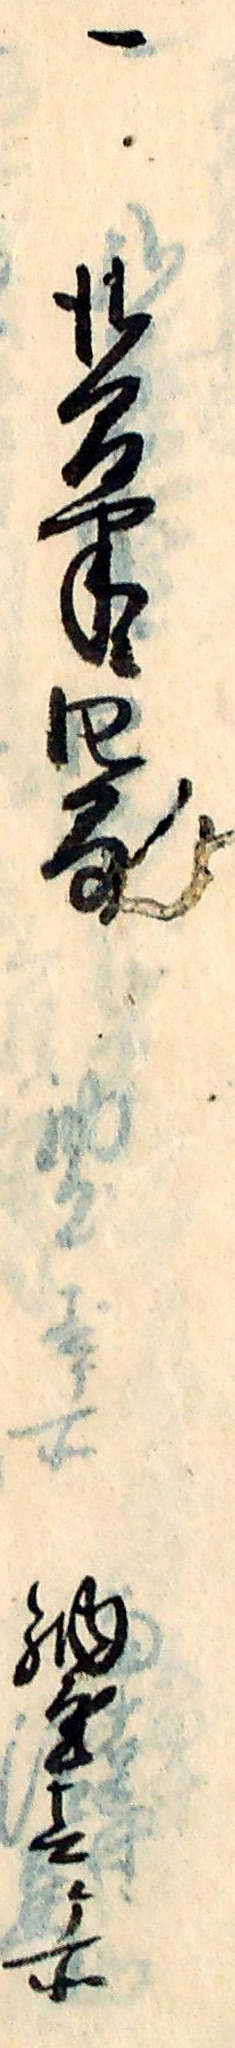一弐間半に四間納屋壱ヶ所
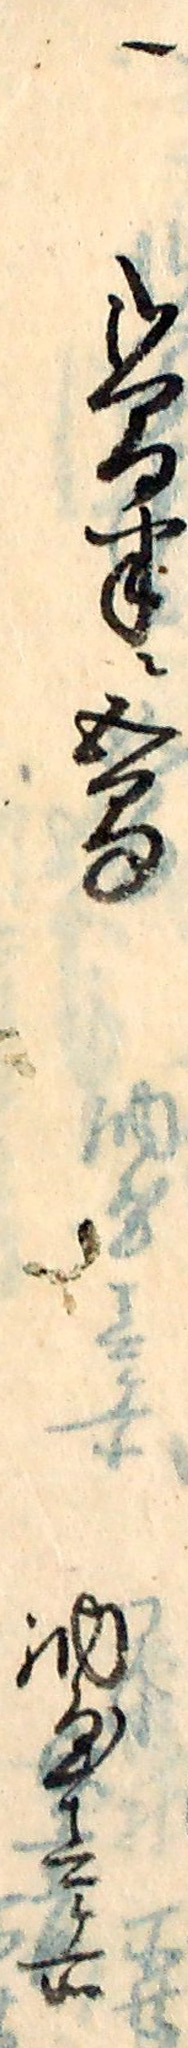一弐間半に五間納屋壱ヶ所
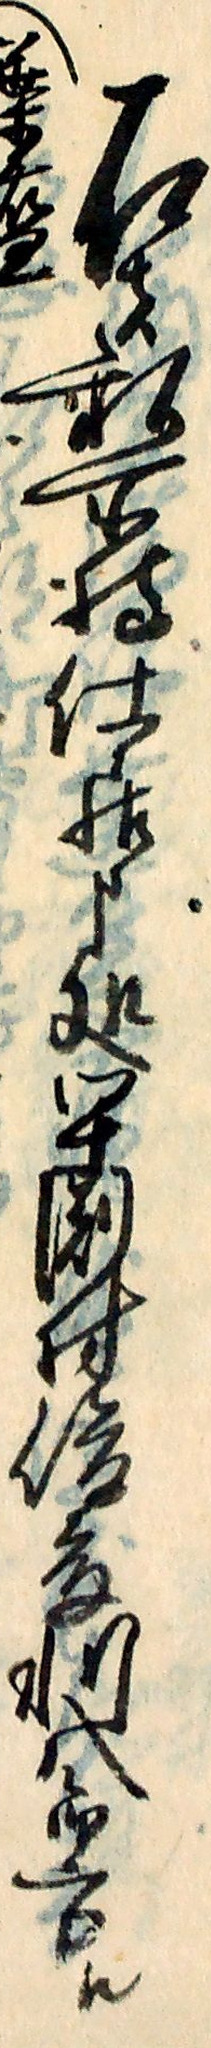右は私所持仕居申処早淵村後藤利八郎方え
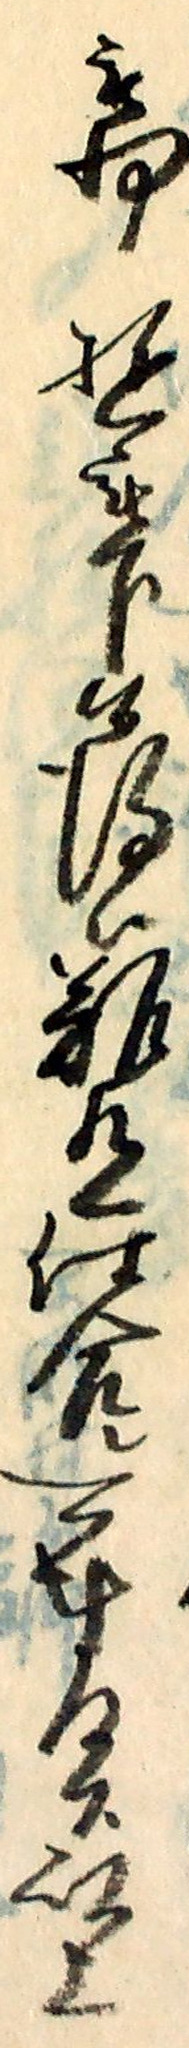被為遊被下候得は難有仕合に可奉存候以上
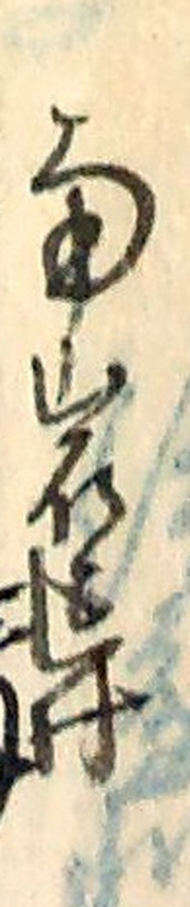南岩延村
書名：諸御願書控(後藤氏壱番）
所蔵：鳴門教育大学 Naruto University of Education
